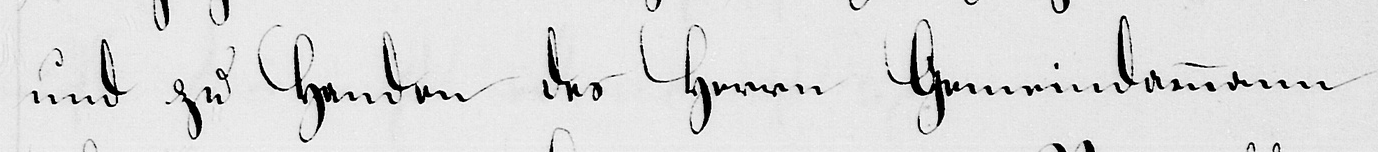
und zu Handen des Herrn Gemeindammann
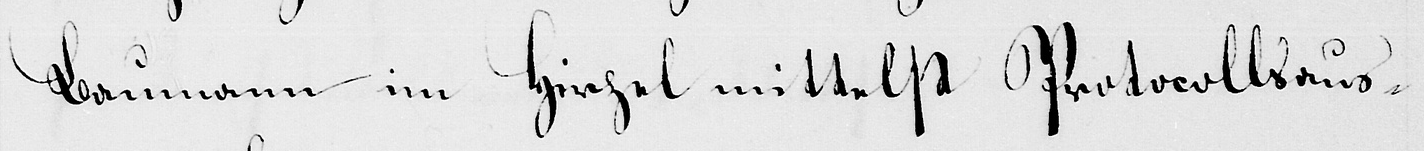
Baumann im Hirzel mittelst Protocollsaus¬
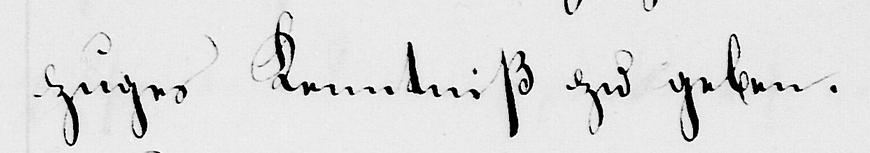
zuges Kenntniß zu geben.
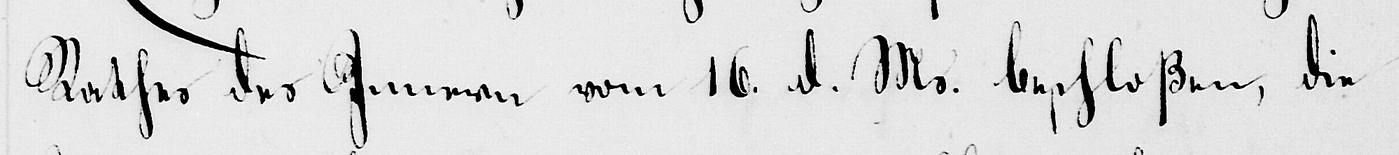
Rathes des Innern vom 16. d. Ms. beschloßen, die
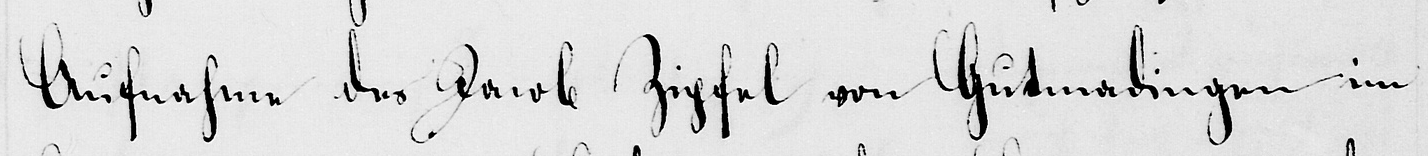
Aufnahme des Jacob Zipfel von Gutmadingen im
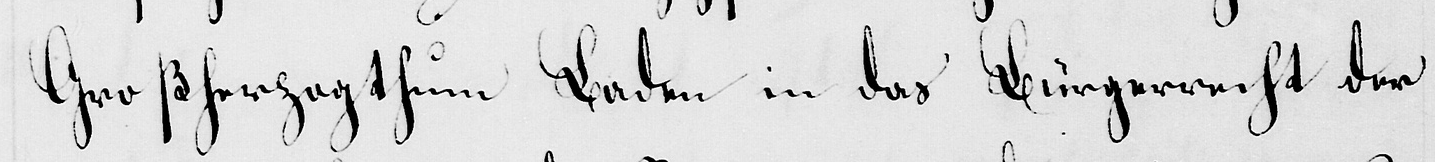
Großherzogthum Baden in das Bürgerrecht der
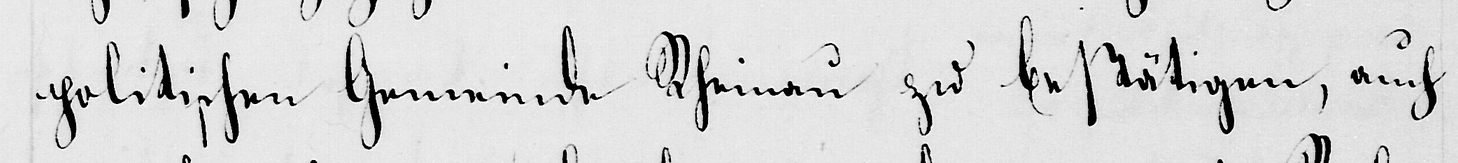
politischen Gemeinde Rheinau zu bestätigen, auch
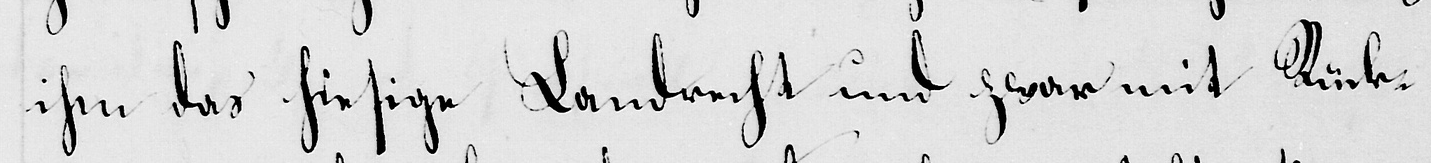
ihm das hiesige Landrecht und zwar mit Rück¬
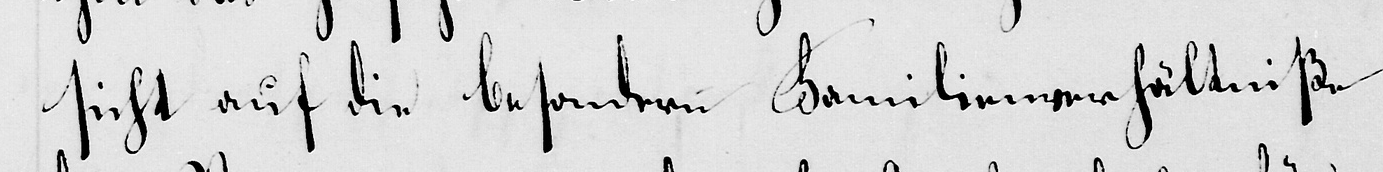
sicht auf die besondern Familienverhältniße
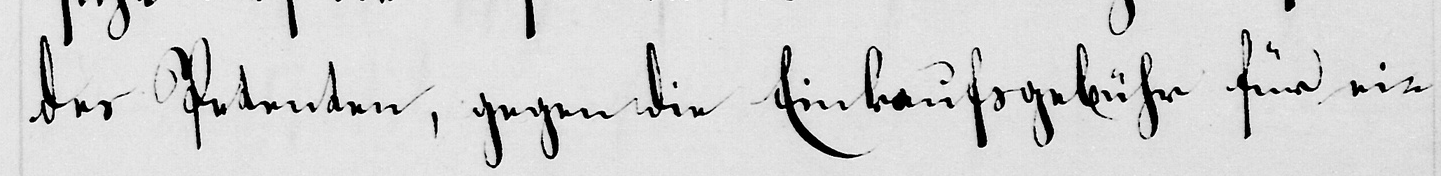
des Petenten, gegen die Einkaufsgebühr für ei-
